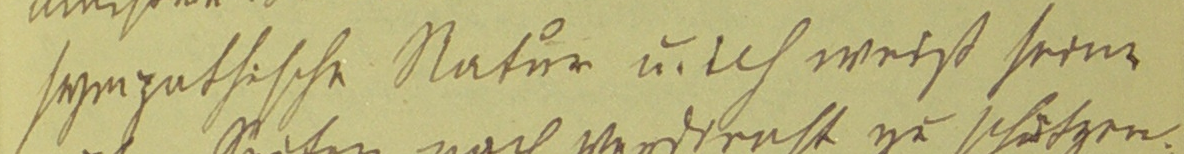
sympathische Natur und ich weiß seine
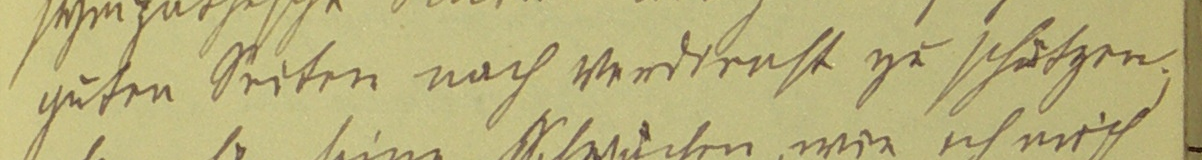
guten Seiten nach Verdienst zu schätzen,
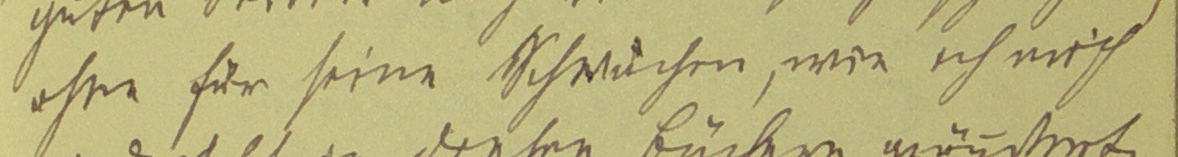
ohne für seine Schwächen, wie ich wied¬
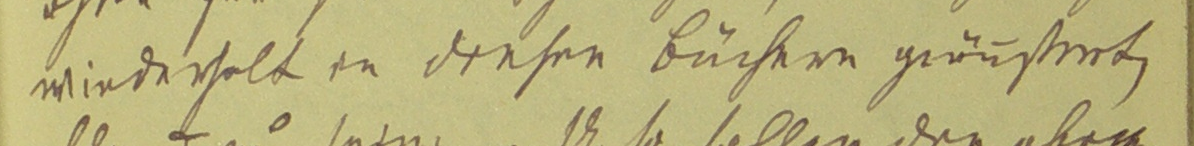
erholt in diesen Büchern geäußert
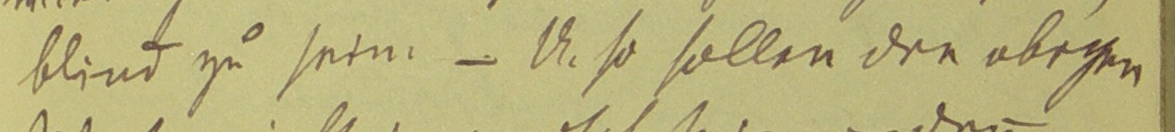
blind zu sein.- Und so sollen die obigen
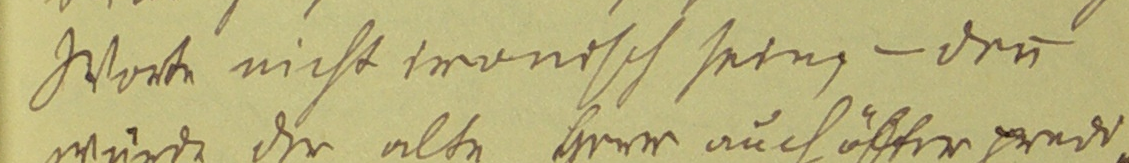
Worte nicht ironisch sein.-Denn
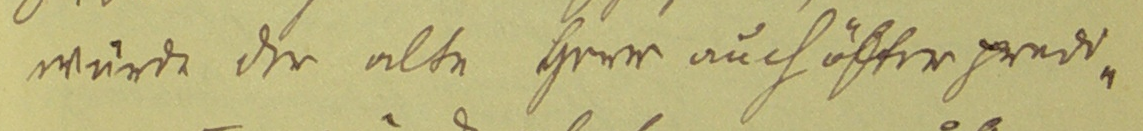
würde der alte Herr auch öfters predi¬
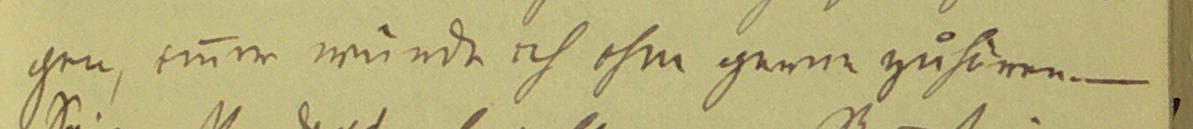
gen, immer würde ich ihm gerne zuhören-
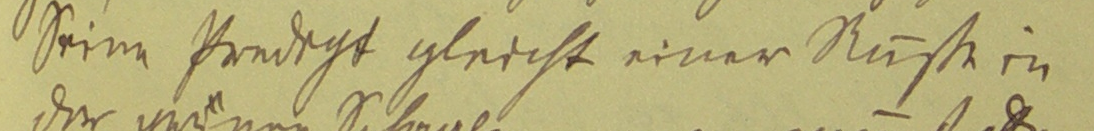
Seine Predigt gleicht einer Nuß in
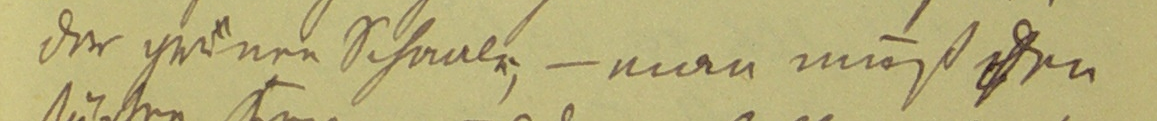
einer grünen Schale-.-man muß den
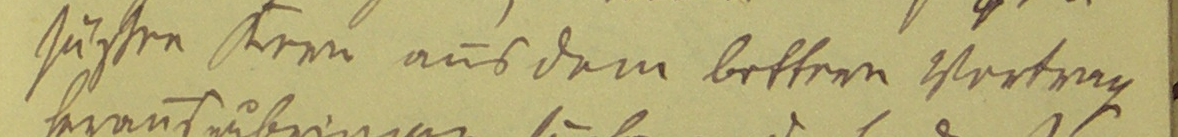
süßen Kern aus dem bitteren Vortrag
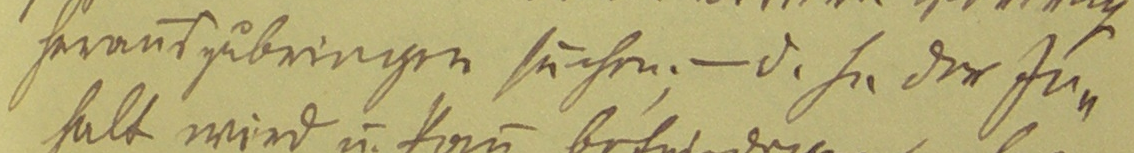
herauszubringen suchen;.-nur so der In¬
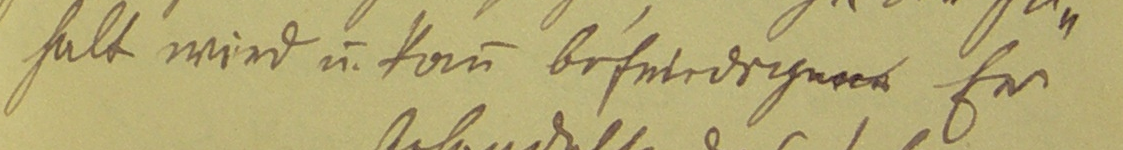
halt wird und kann befriedigen. Er
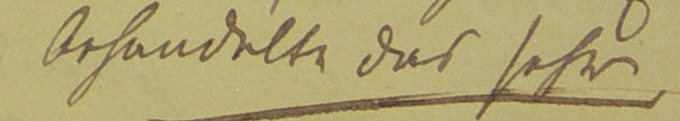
behandelte das Jahr
